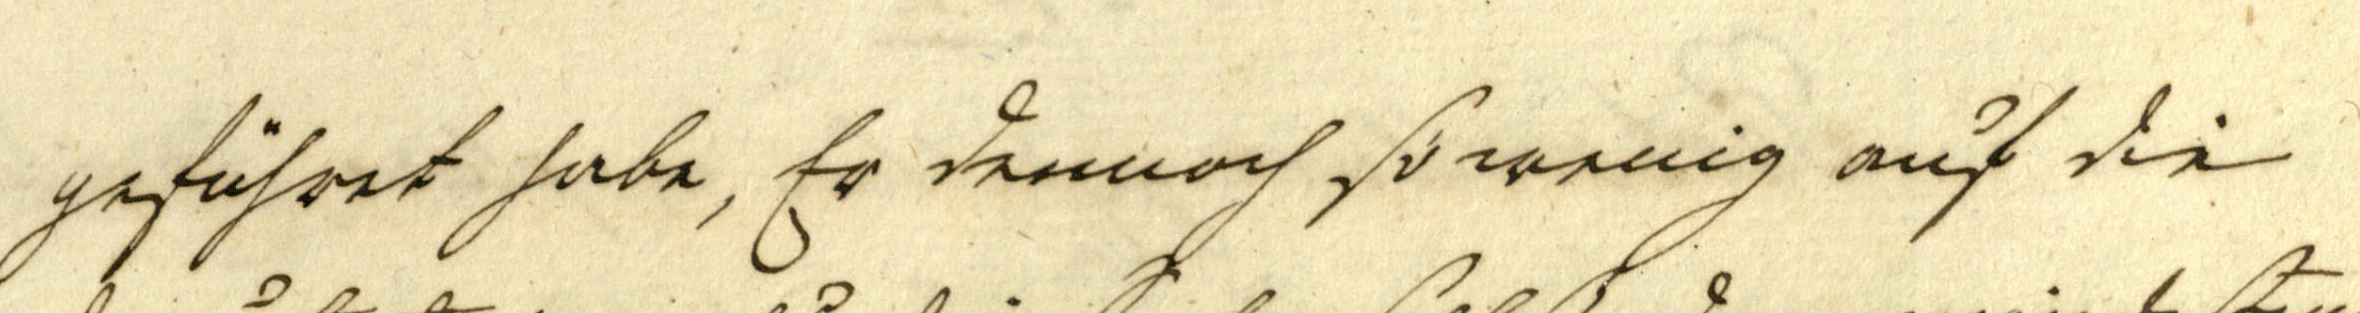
geführet habe, Er dennoch so wenig auf die
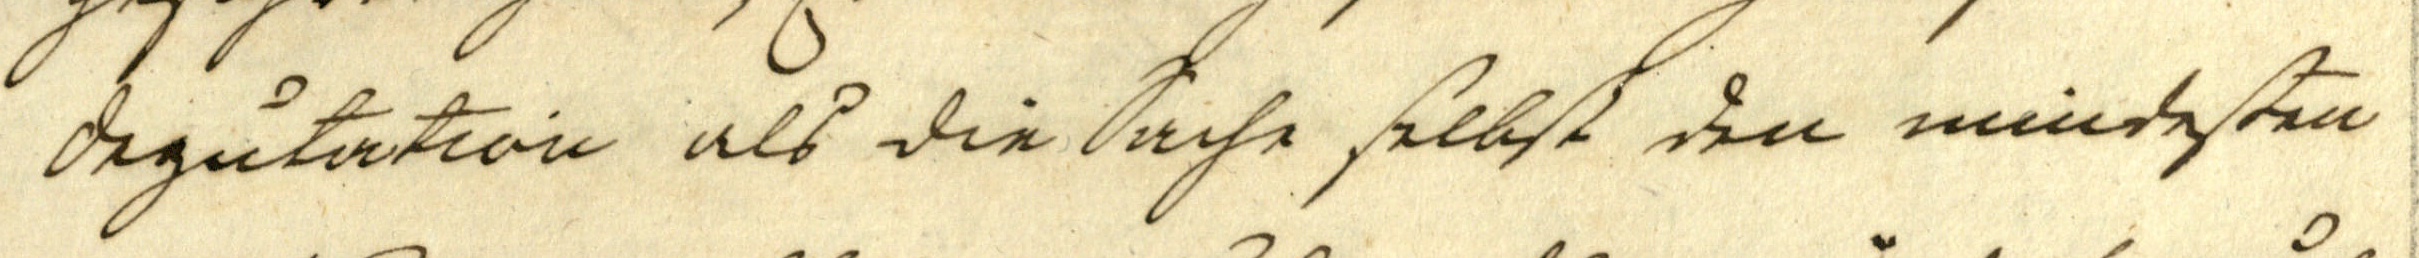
Deputation als die Sache selbst den mindesten
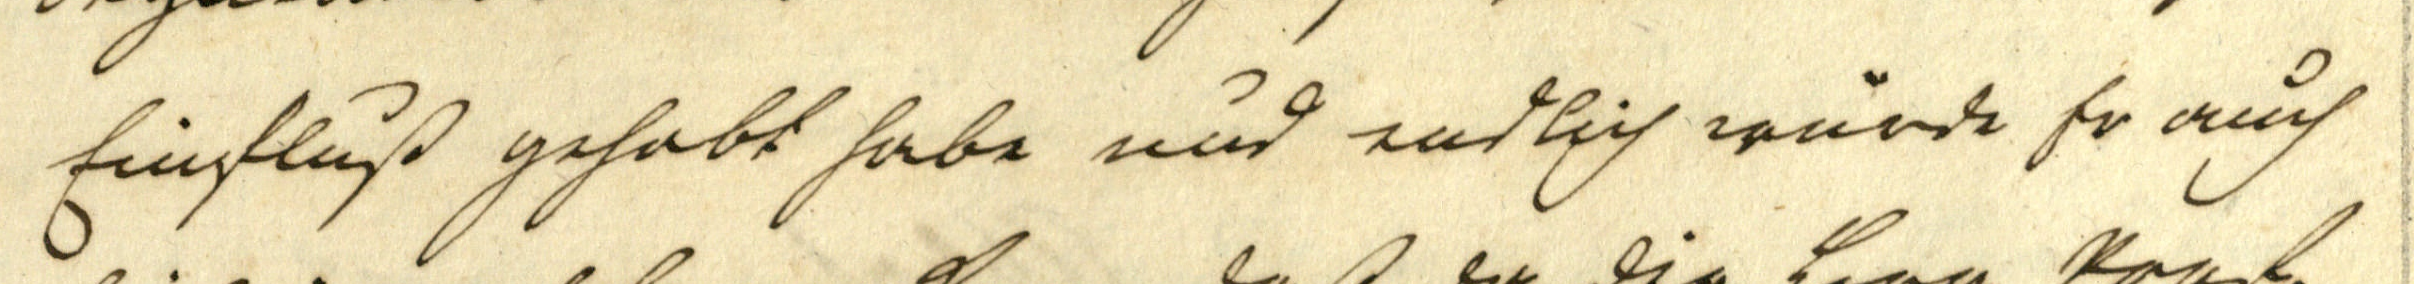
Einfluß gehabt habe und endlich würde Er auch
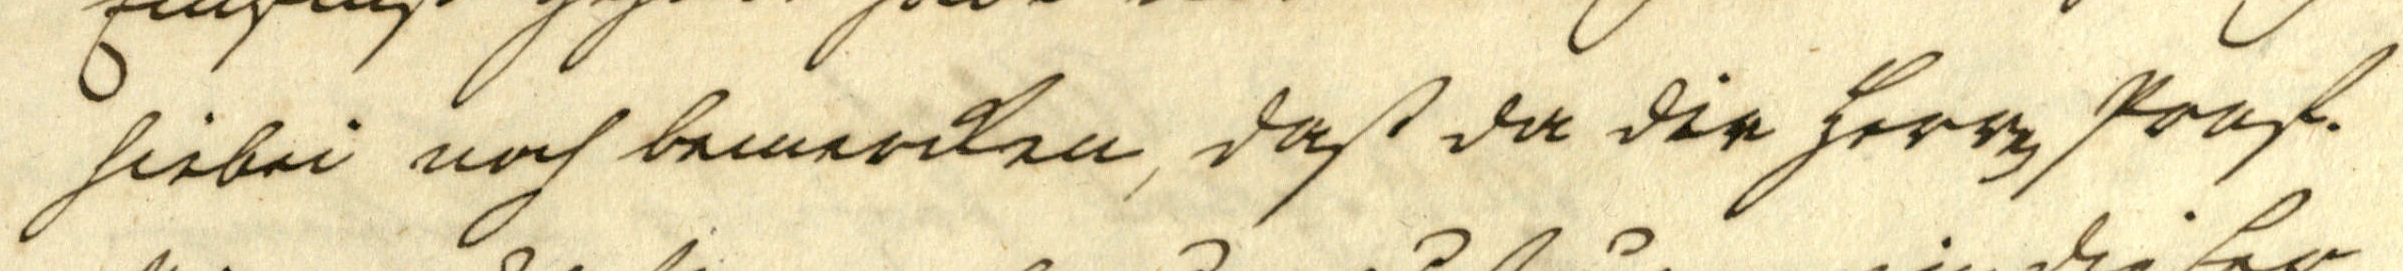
hiebei noch bemercken, daß da die Herrn Prof.
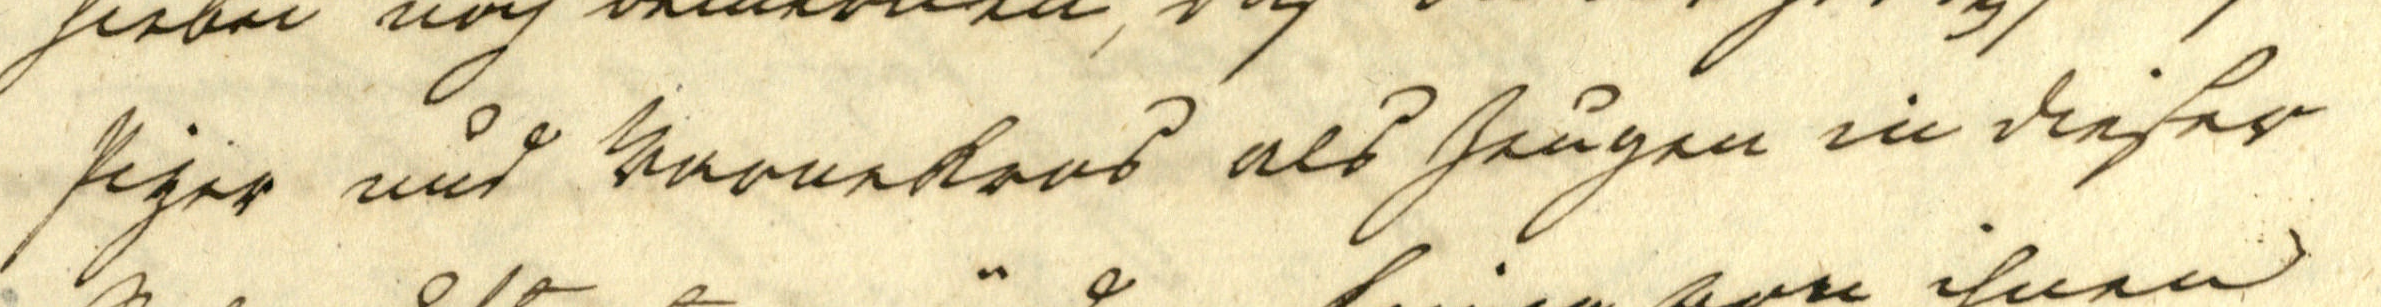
Piper und Warnekros als Zeugen in dieser
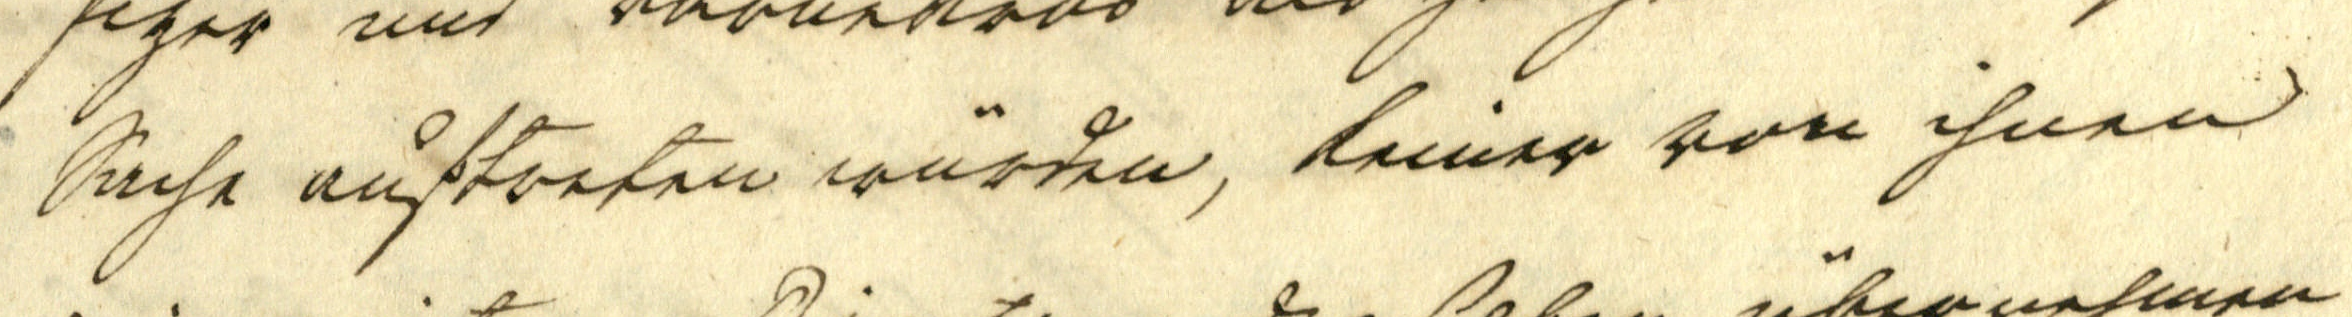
Sache auftreten würden, keiner von ihnen
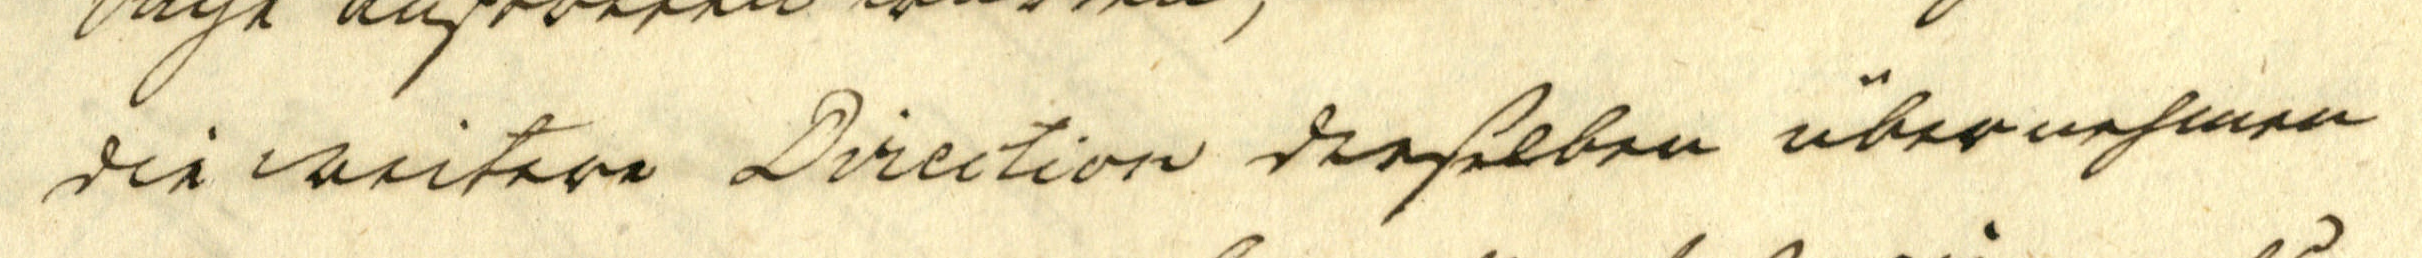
die weitere Direction derselben über nehmen
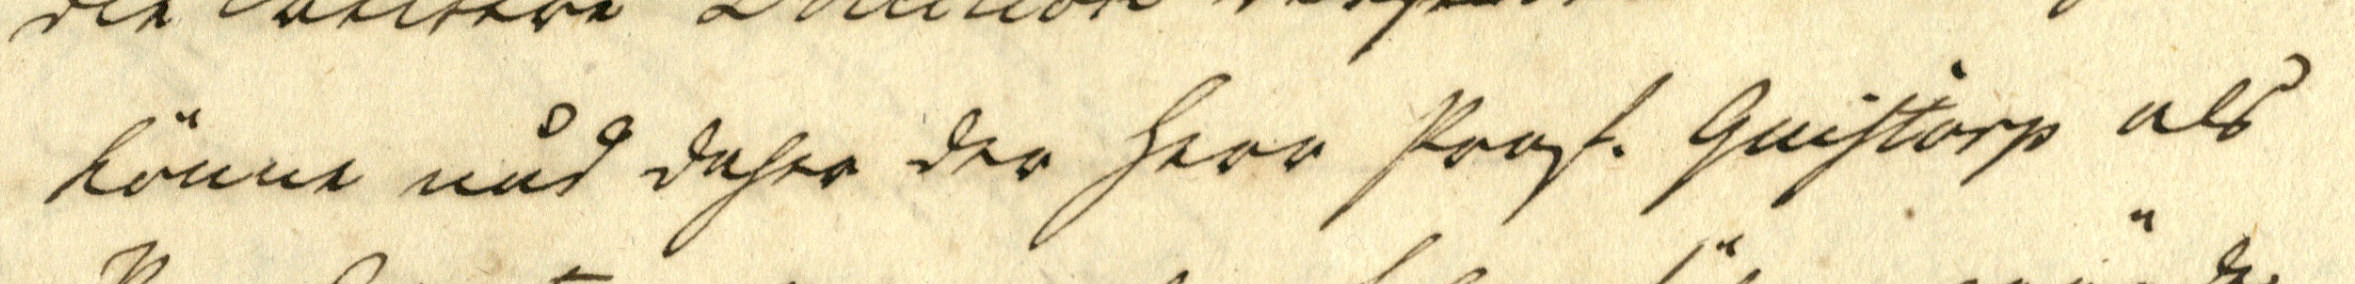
könne und daher der Herr Prof. Quistorp als
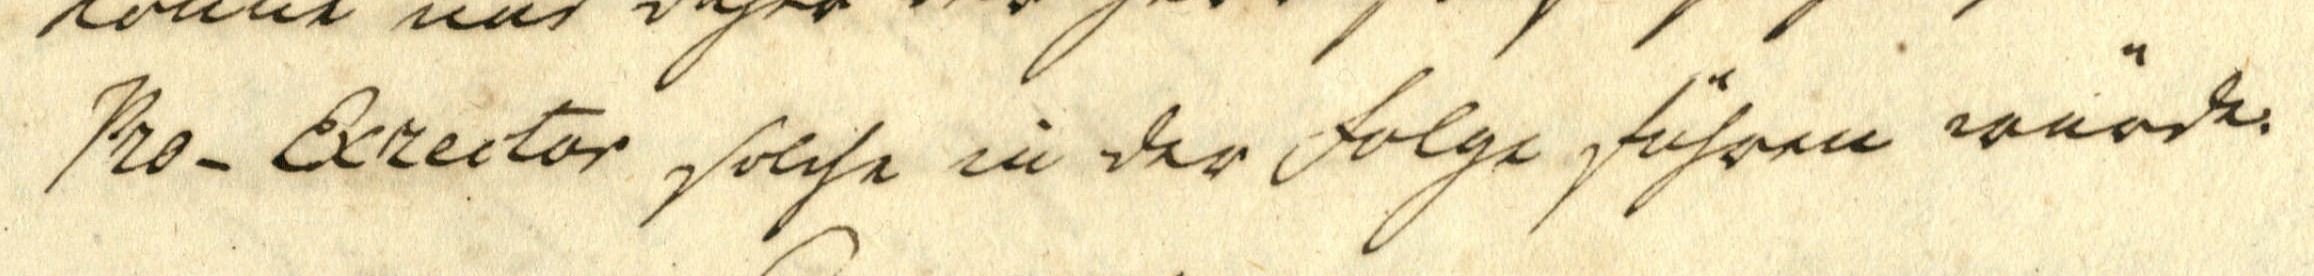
Pro. Exrector solche in der Folge führen würde.
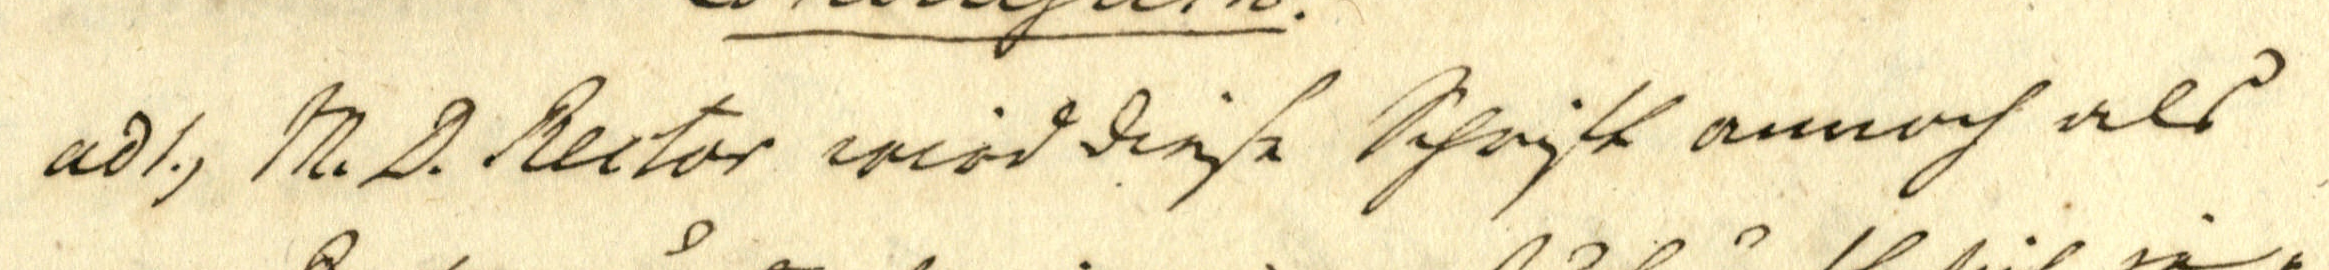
ad 1, M. D. Rector wird diese Schrift annoch als
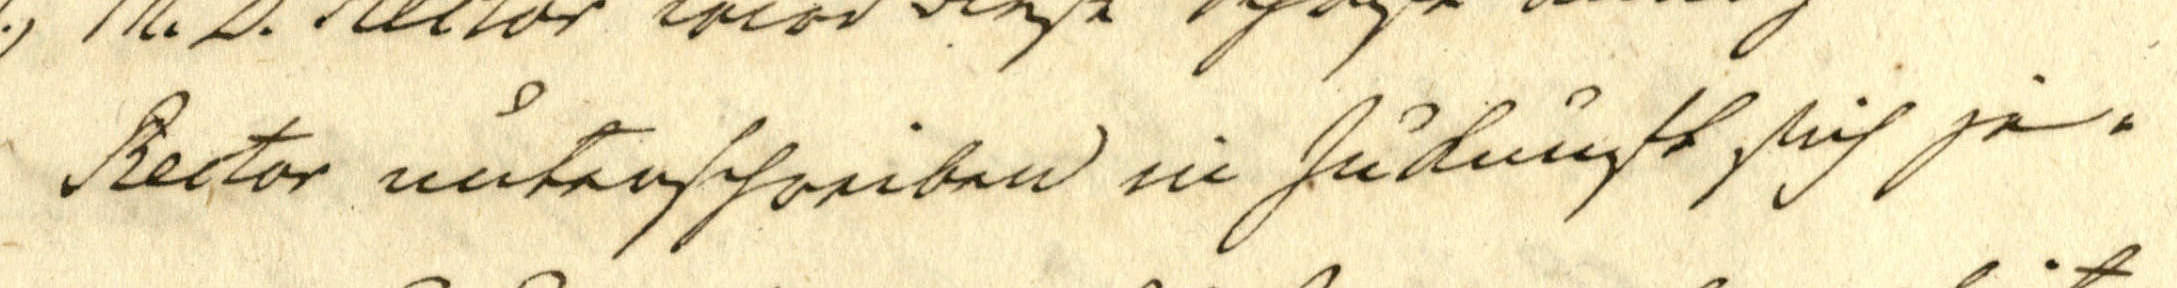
Rector unterschreiben in Zukunft sich je¬
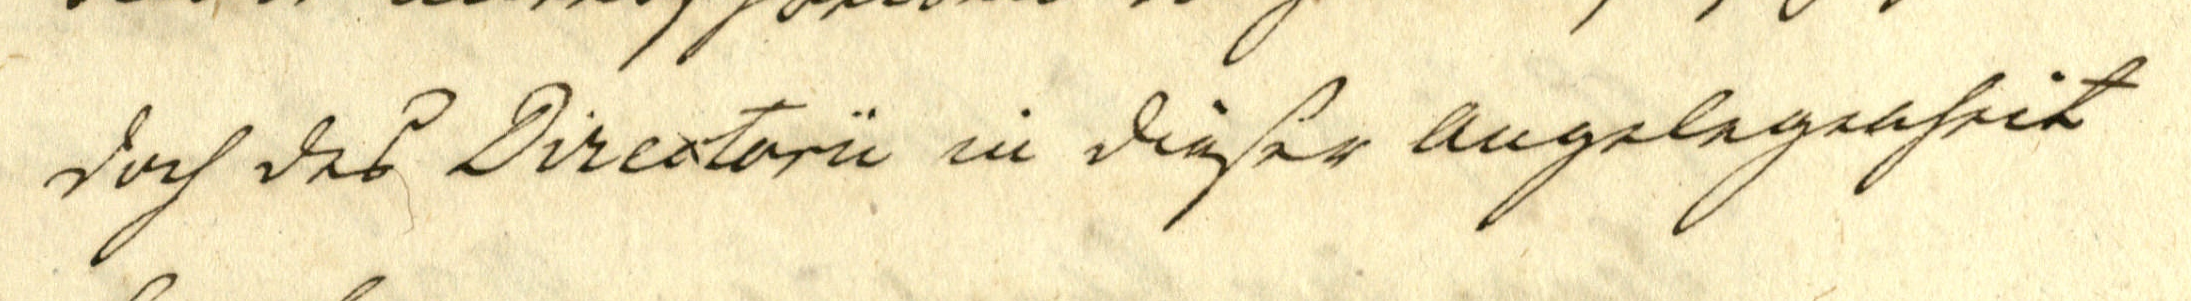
doch des Directorii in dieser Angelegenheit
